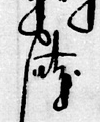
ls¬
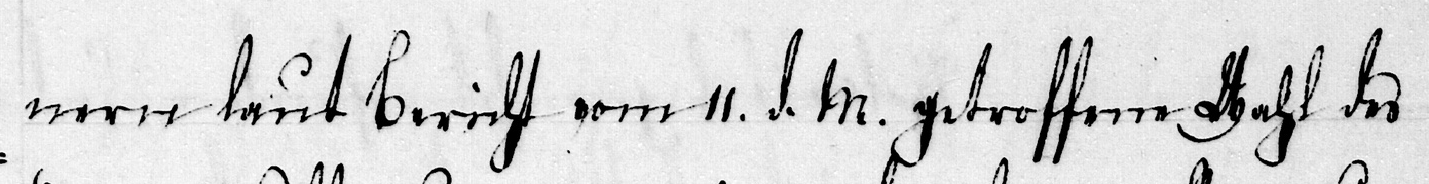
nern laut Bericht vom 11. d. M. getroffene Wahl des
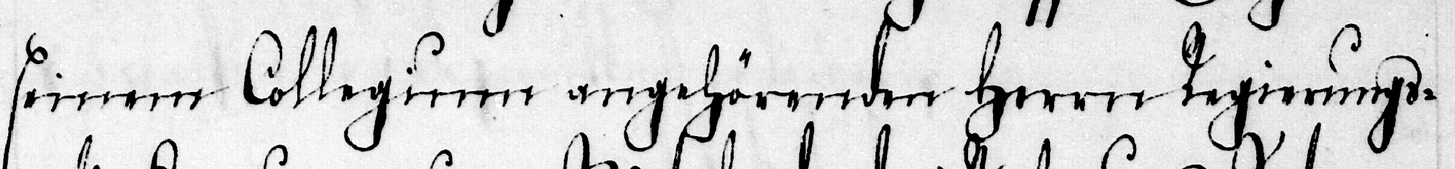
seinem Collegium angehörenden Herrn Regierungs¬
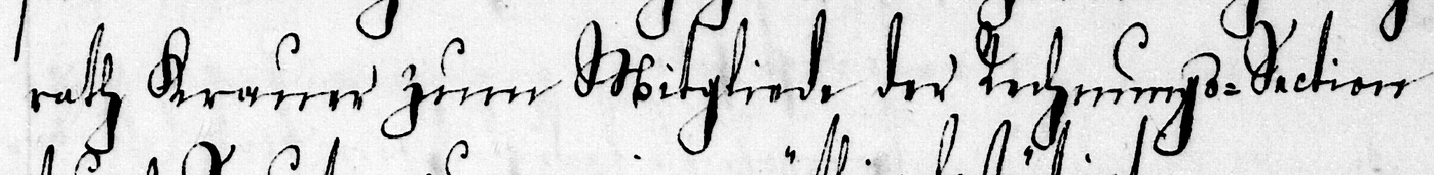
rath Krauer zum Mitgliede der Rechnungs-Section
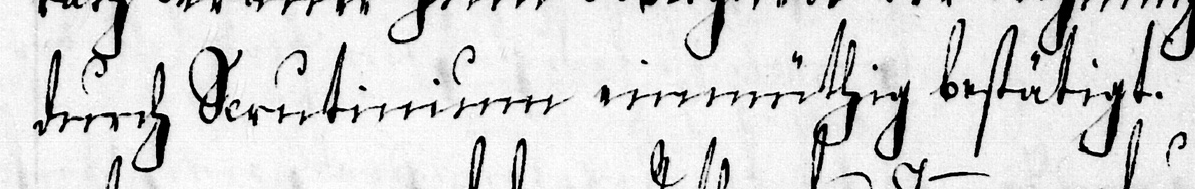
durch Scrutinium einmüthig bestätigt.
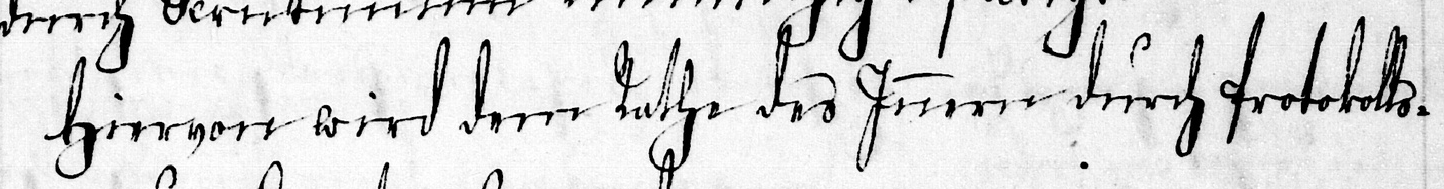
Hiervon wird dem Rathe des Innern durch Protokol¬
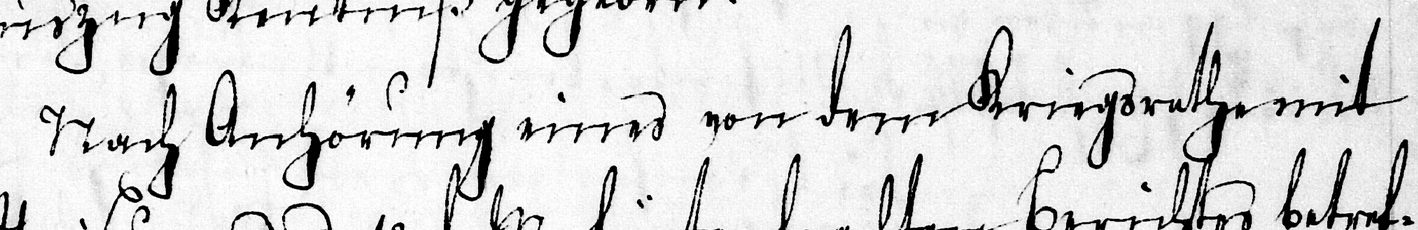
Nach Anhörung eines von dem Kriegsrathe mit
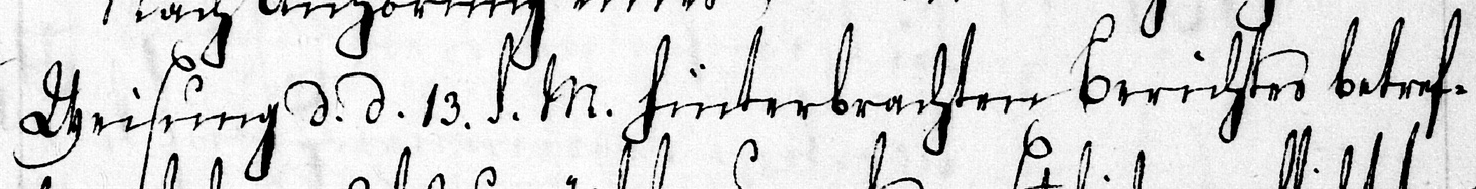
Weisung d. d. 13. d. M. hinterbrachten Berichtes betref¬
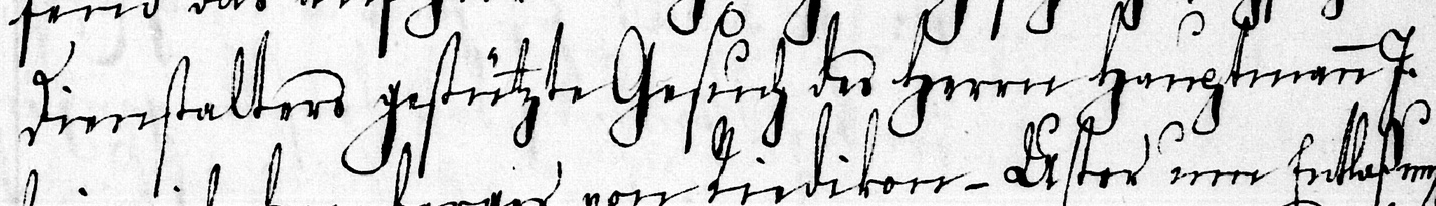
Dienstalters gestützte Gesuch des Herrn Hauptmann J.
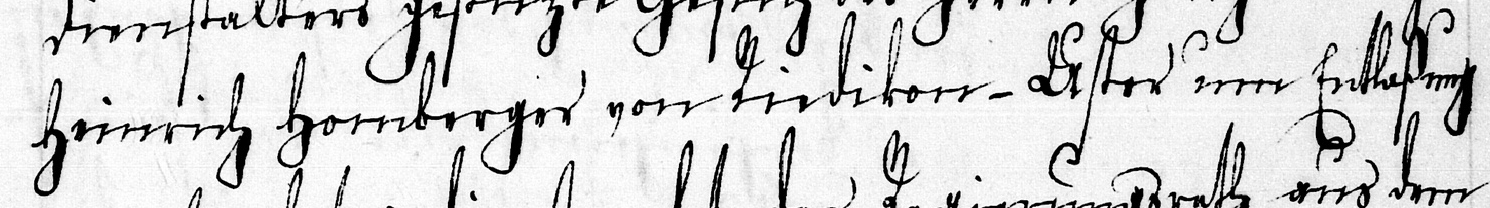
Heinrich Homberger von Riedikon-Uster um Entlaßung
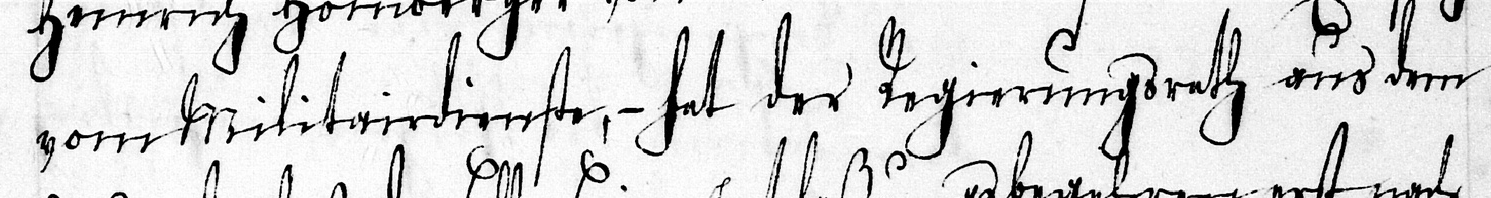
vom Militairdienste, – hat der Regierungsrath aus dem
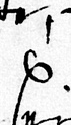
es
